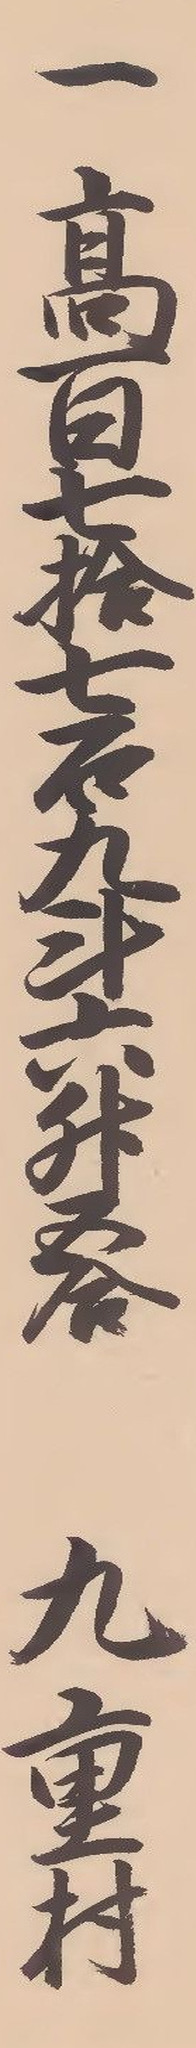一高百七拾七石九斗六升五合九重村
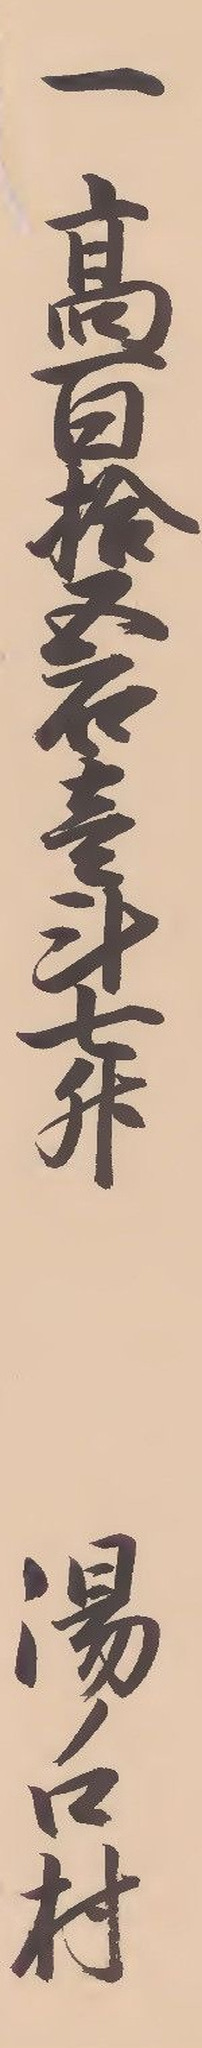一高百拾五石壱斗七升湯ノ口村
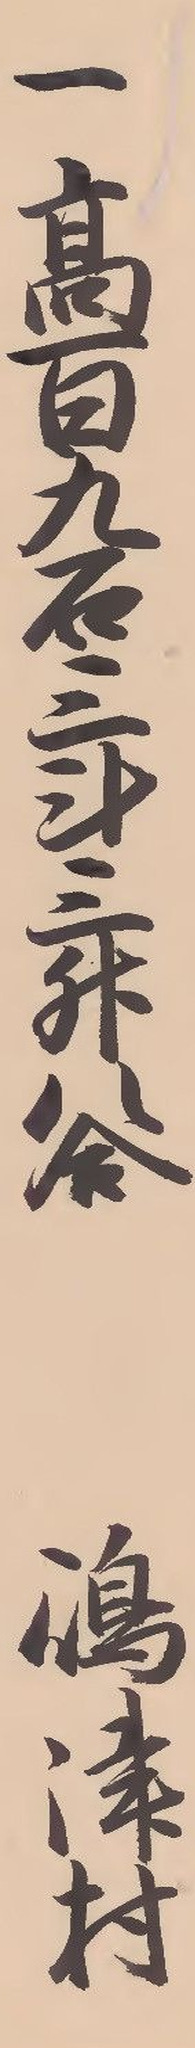一高百九石三斗三升八合島津村
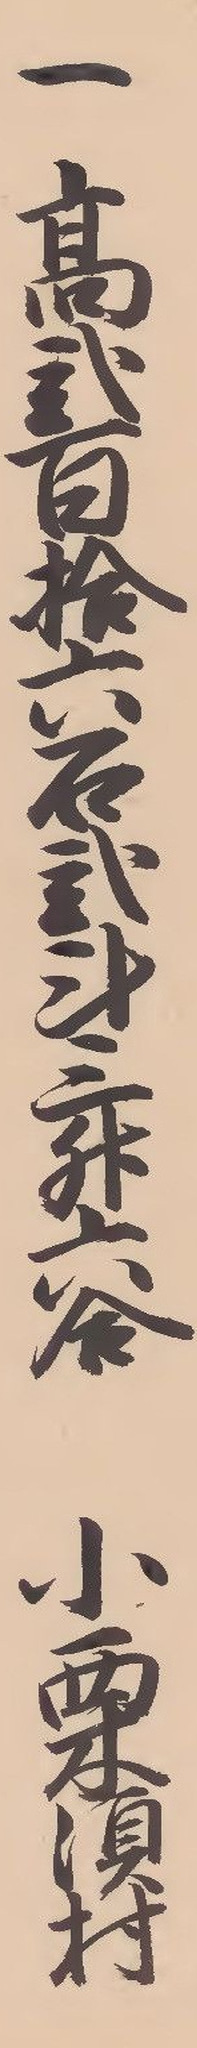一高弐百拾六石弐斗三升六合小栗須村
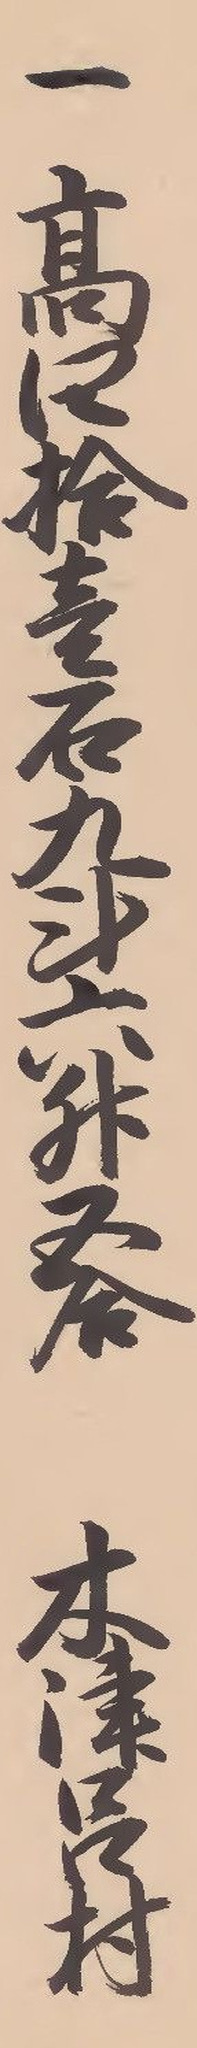一高四拾壱石九斗六升五合木津呂村
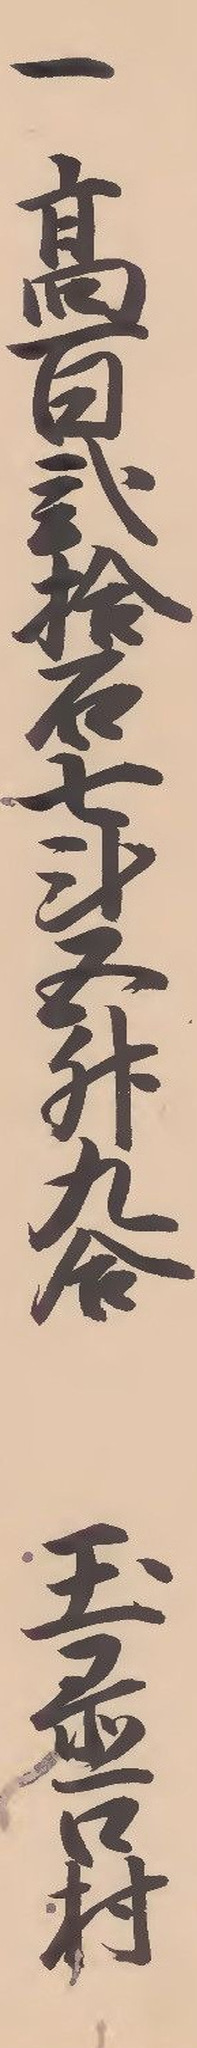一高百弐拾石七斗五升九合玉置口村

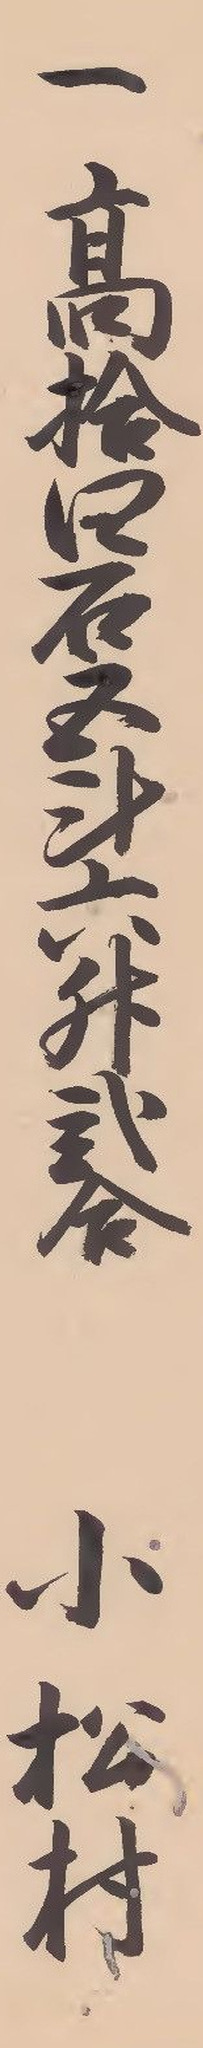一高拾四石五斗六升弐合小松村
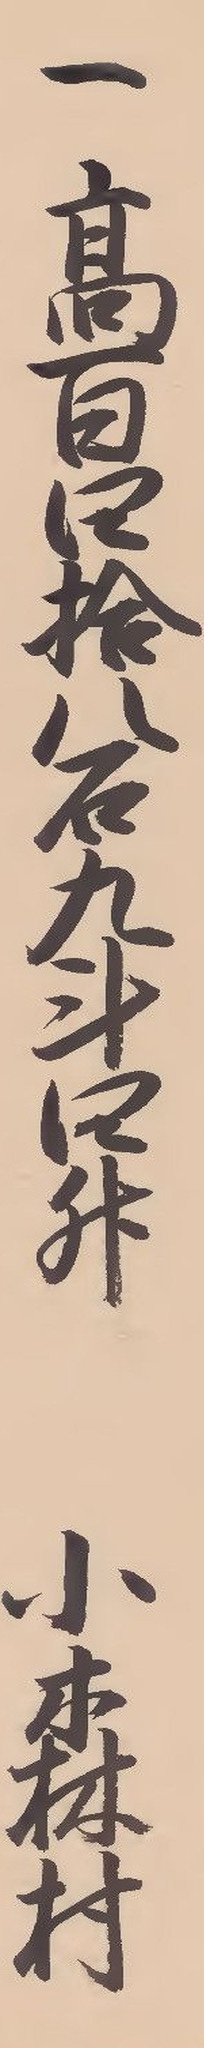一高百四拾八石九斗四升小森村
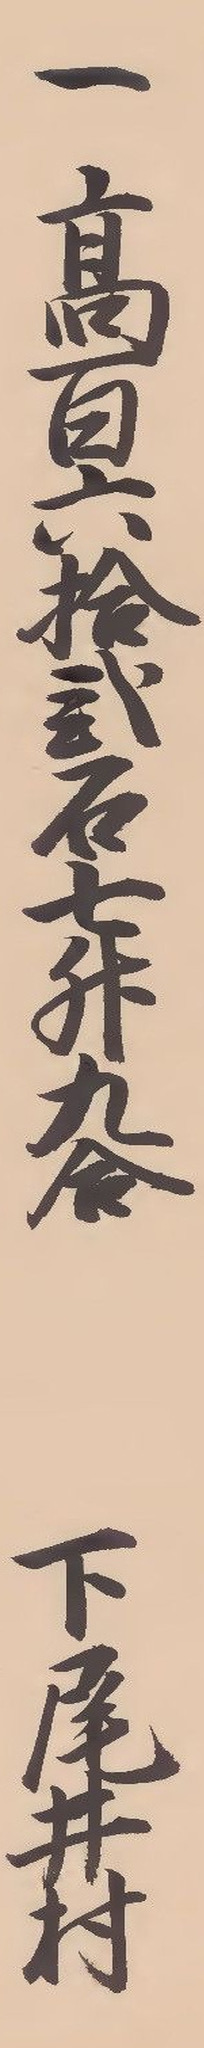一高百六拾弐石七升九合下尾井村
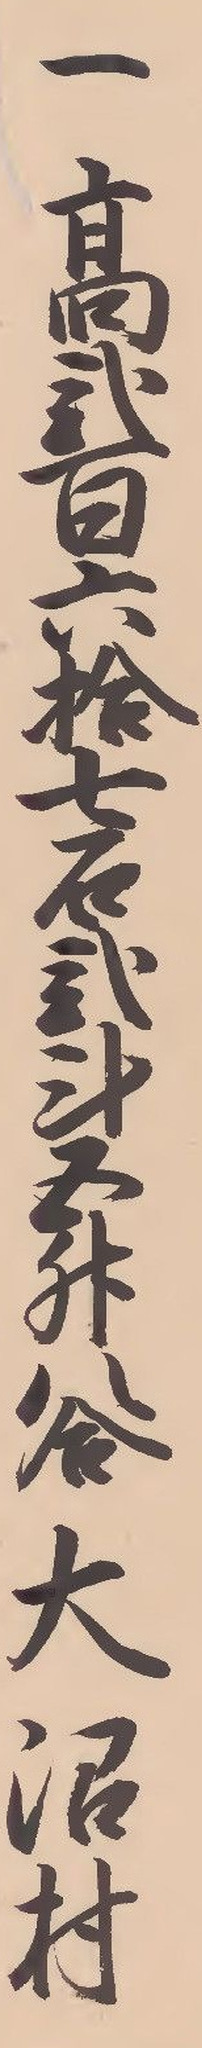一高弐百六拾七石弐斗五升八合大沼村
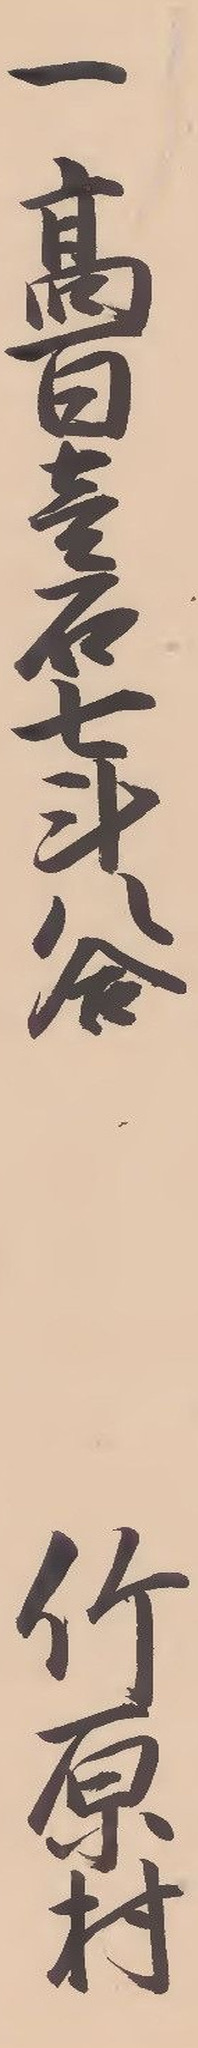一高百壱石七斗八合竹原村
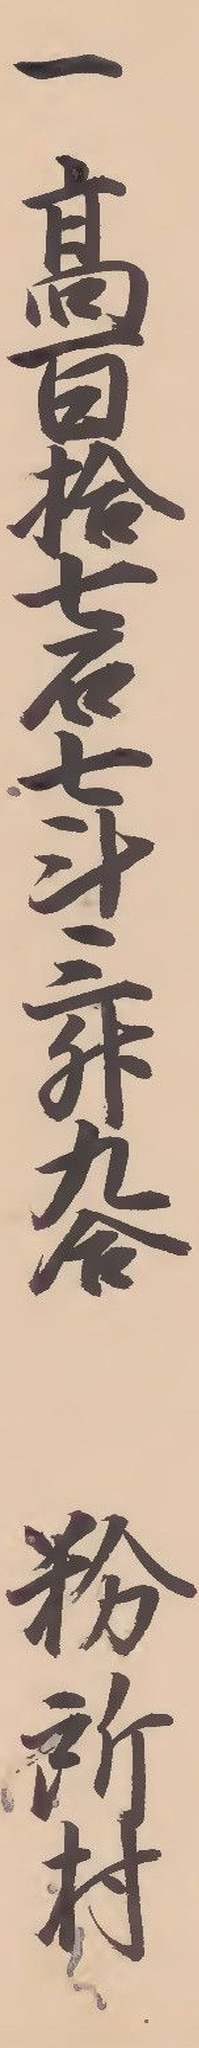一高百拾七石七斗三升九合粉所村

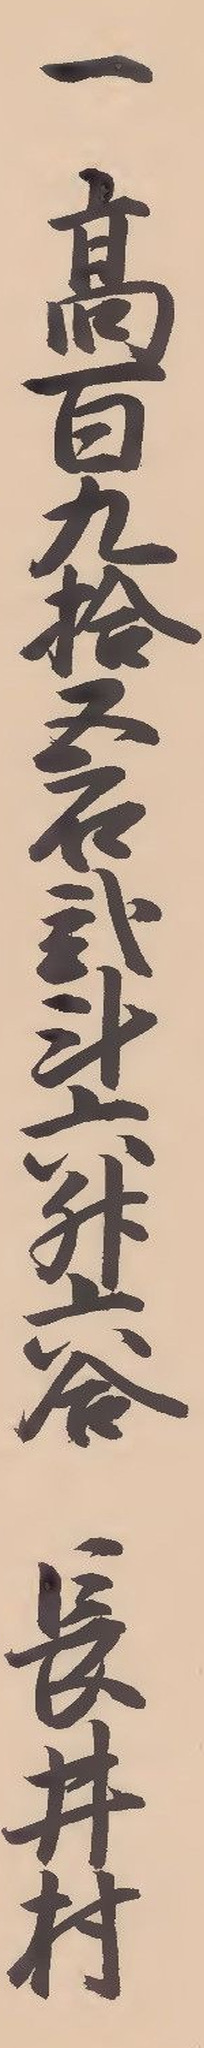一高百九拾五石弐斗六升六合長井村
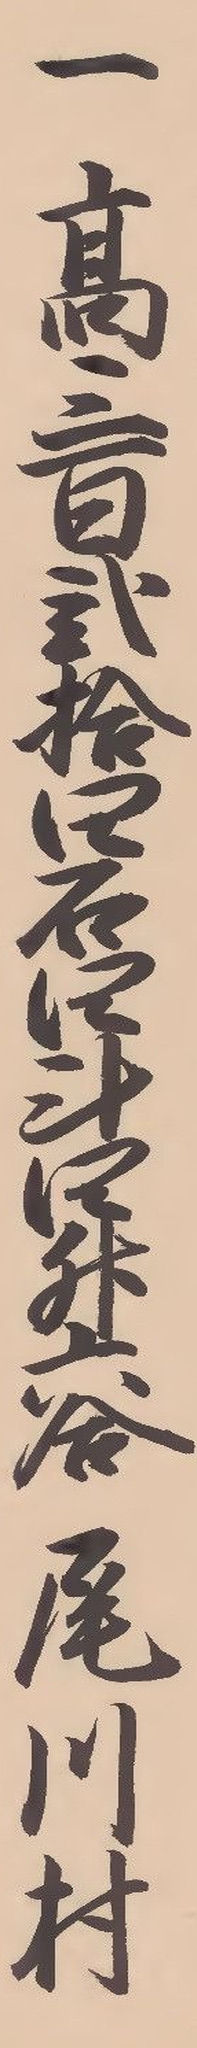一高三百弐拾四石四斗四升六合尾川村
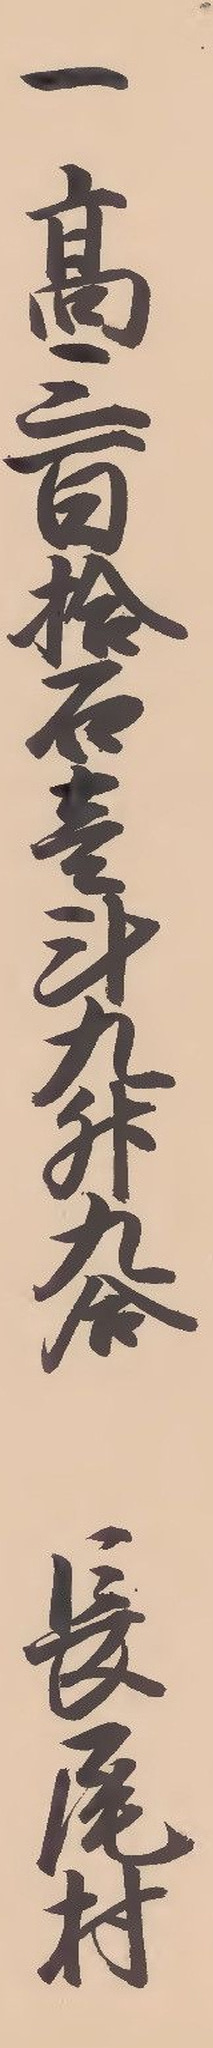一高三百拾石壱斗九升九合長尾村
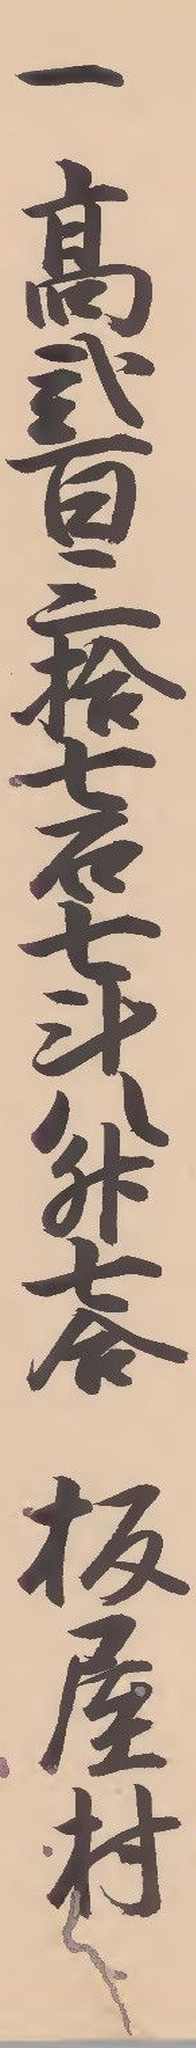一高弐百三拾七石七斗八升七合板屋村
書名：紀伊国郷帳
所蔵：国立公文書館 National Archives of Japan
